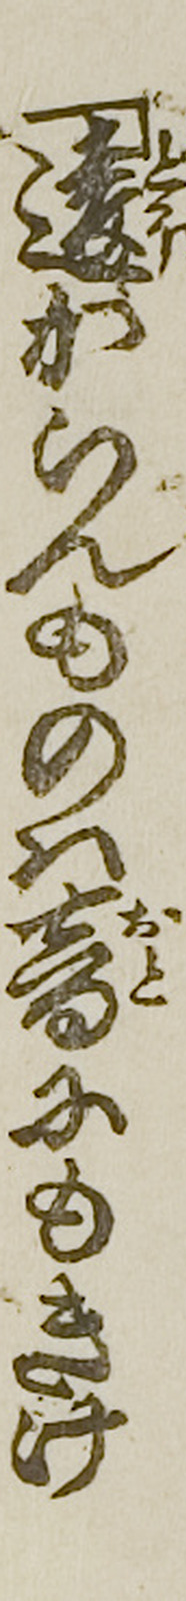〽遠からんものは音にもきけ
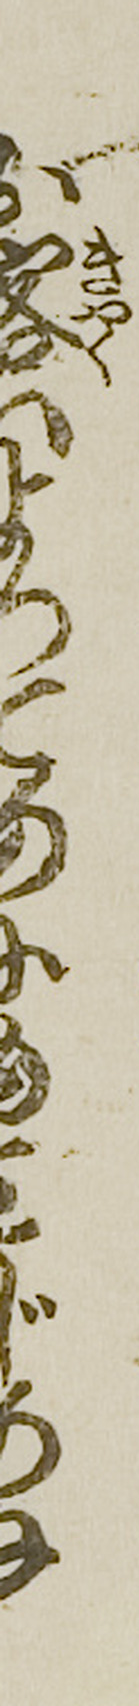お客はよつてめにもみじめな
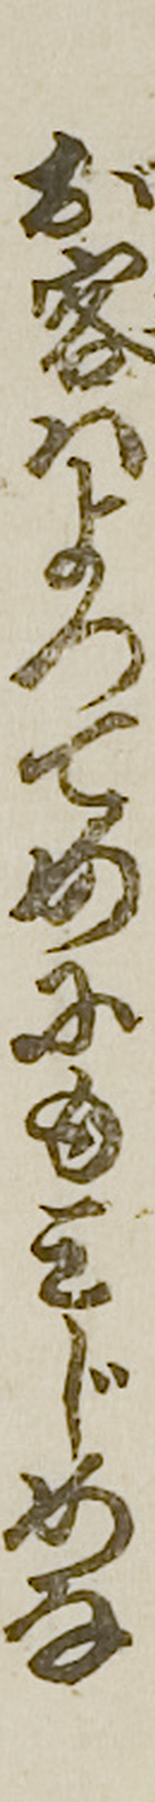お客はよつてめにもみじめな
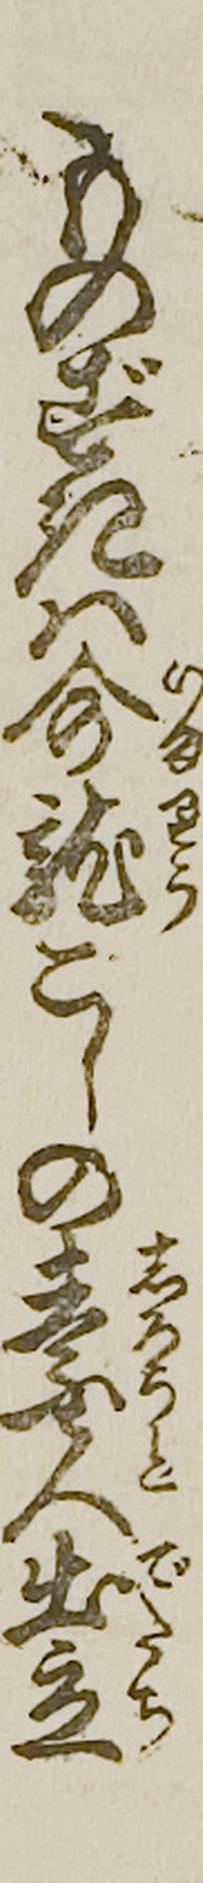ものずきは今龍こしの素人出立
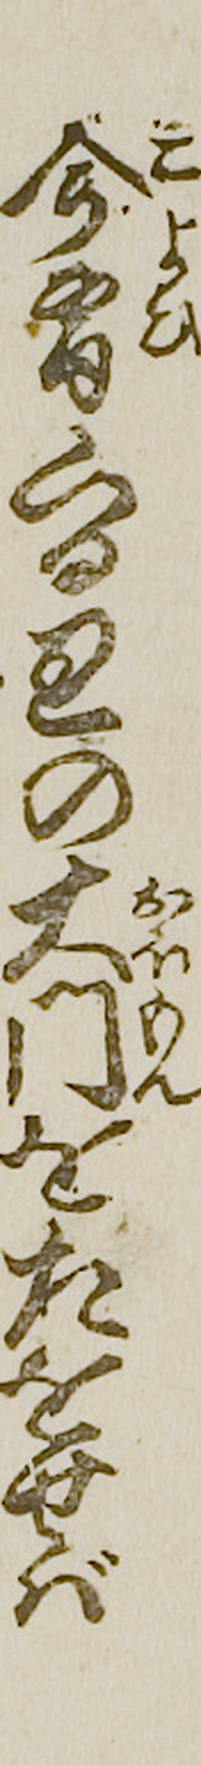今宵くるわの大門をたをせば
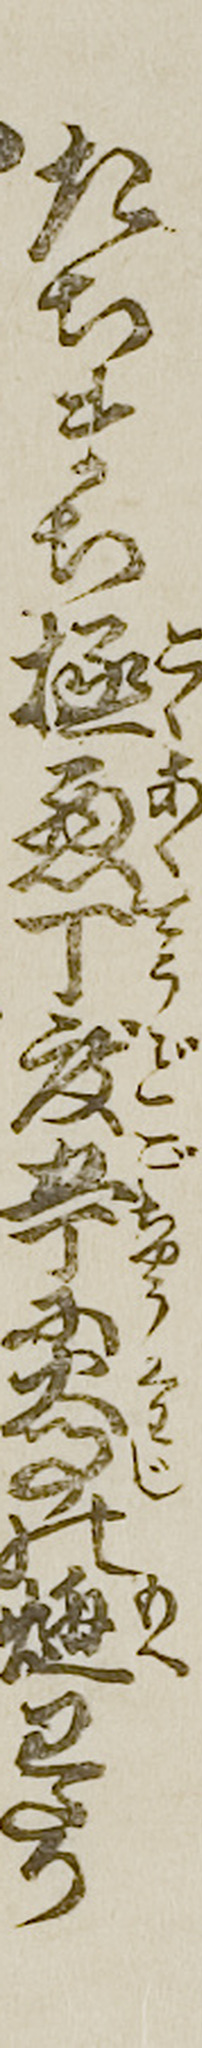たちまち極悪丁度五丁に火事の燃わたり
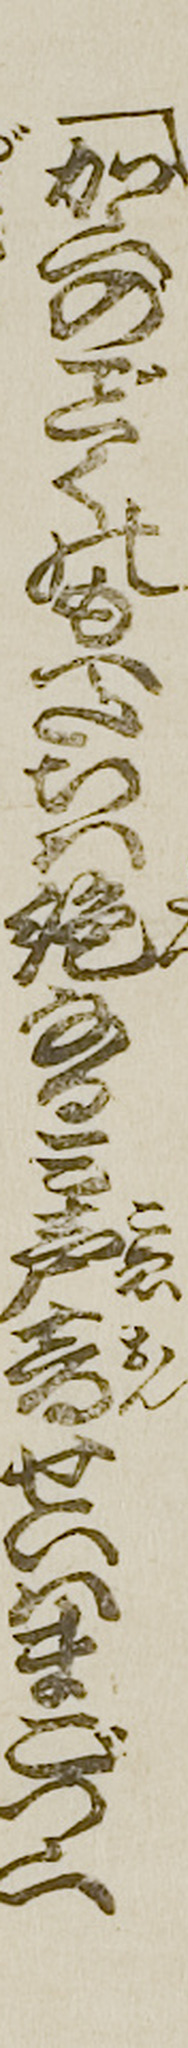〽かくのごとくのもへたちは絶なるみ声音せいはまごつく
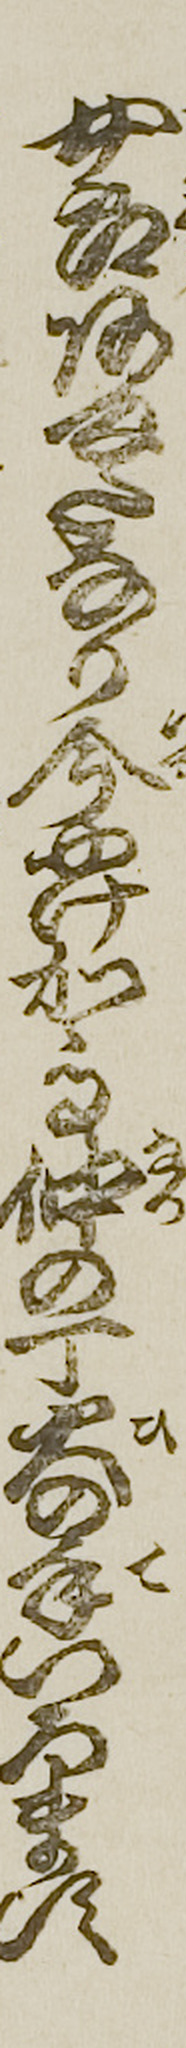女郎あまたなり今やけかゝる仲の丁火の手いろます
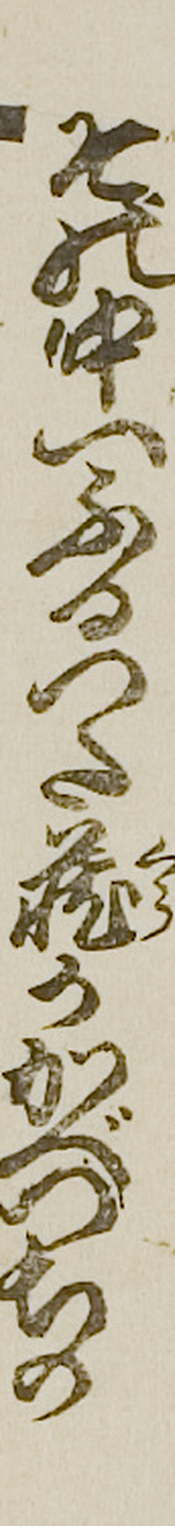その中へふるつた蔵かかべつちの
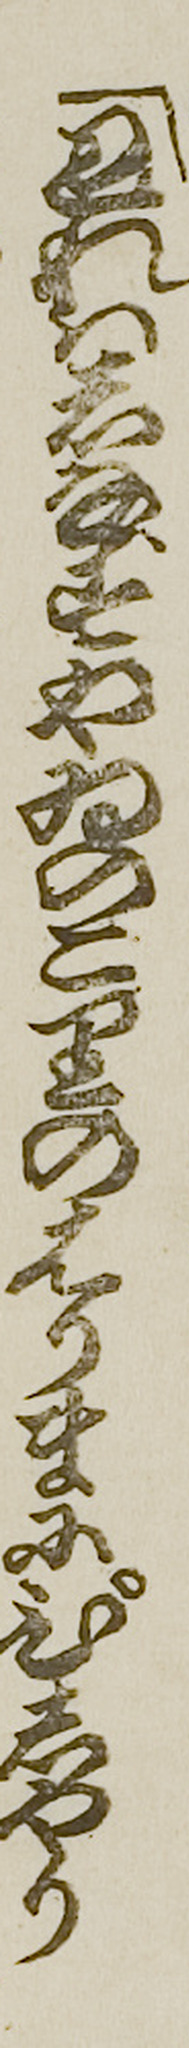〽われはしなすやゐのこりのはりまにぴしやり
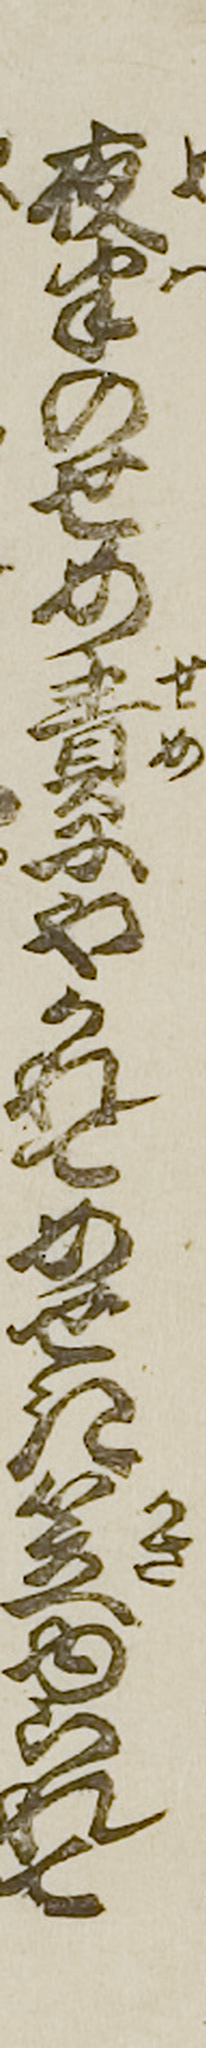夜半のせめ責にやかれてかせき笠ゆられて
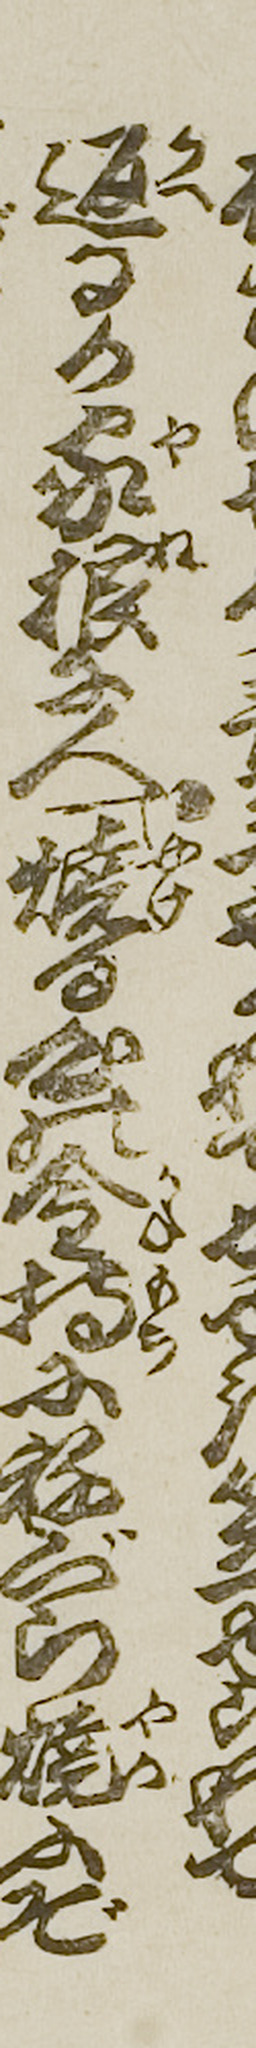返るか家根に人●〽焼る心の金持にねぐら焼ふぞ
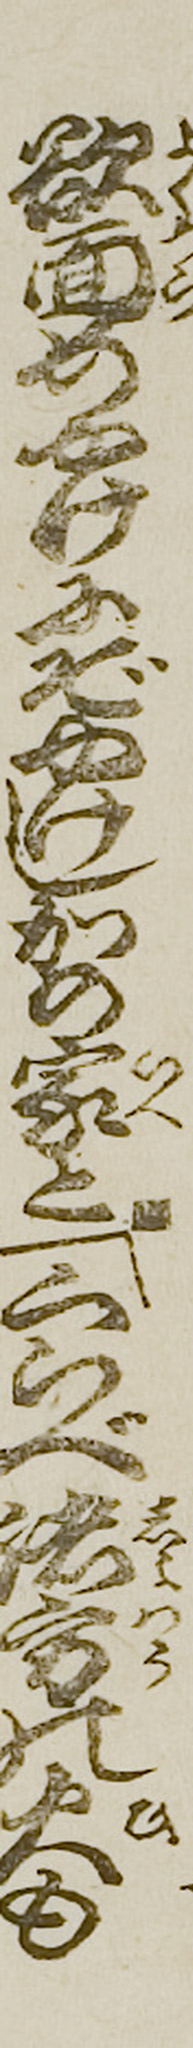欲面めやけにぞやけしかの家と〽くらべ諸方の火も
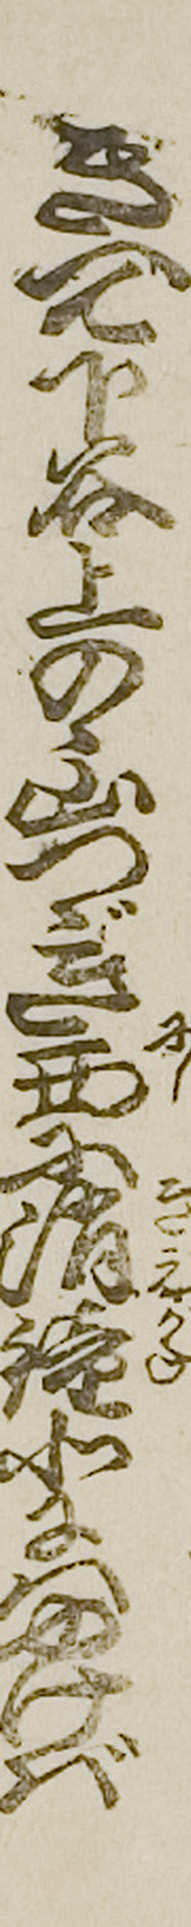きへて下谷上のゝ山つゞき西に消鐘北にはゆけば
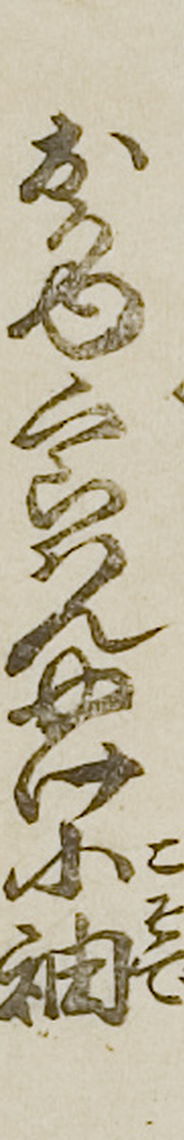おかゆくらはんやけ小袖
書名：さやあて
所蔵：東京大学総合図書館 General Library in the University of Tokyo, JAPAN
